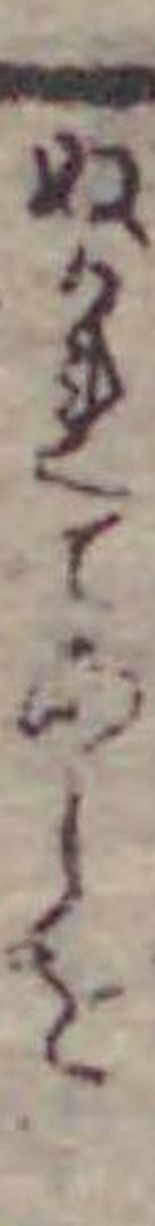ぬかれてあしを
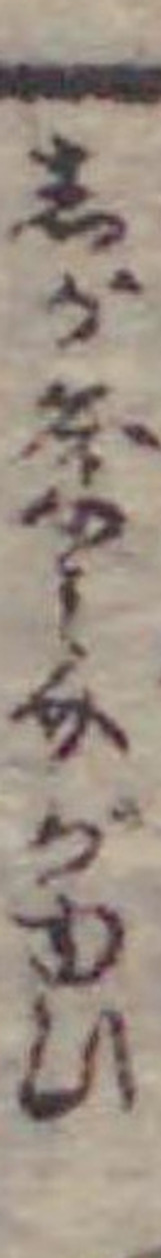しが久米之介がゆひ
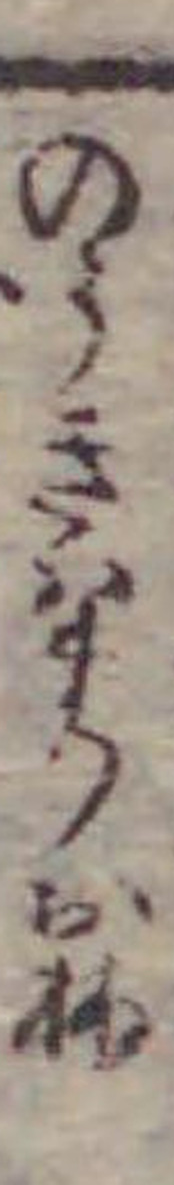のうきはまりお梅
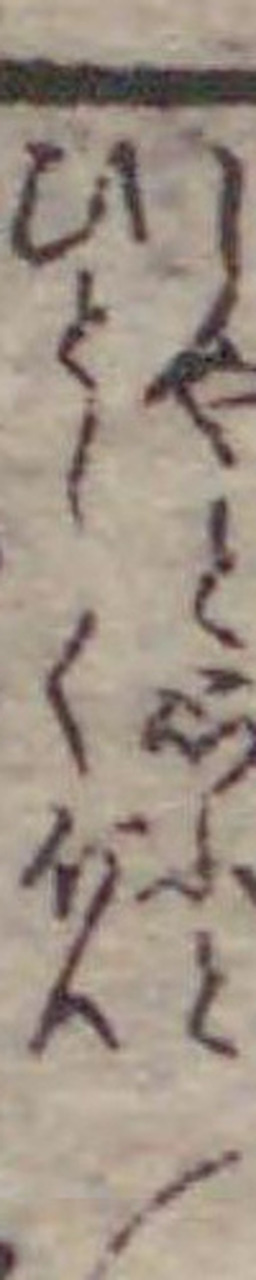ひとしくぼん
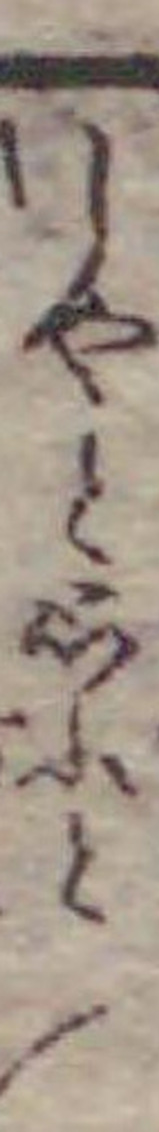しやと思ふと
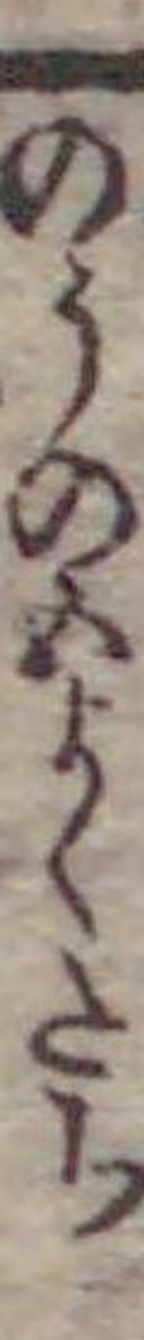のうの五よくたち
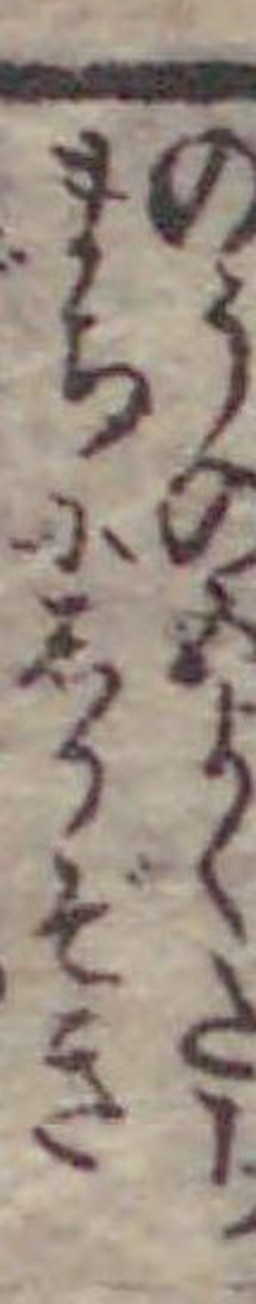まちにしりぞき
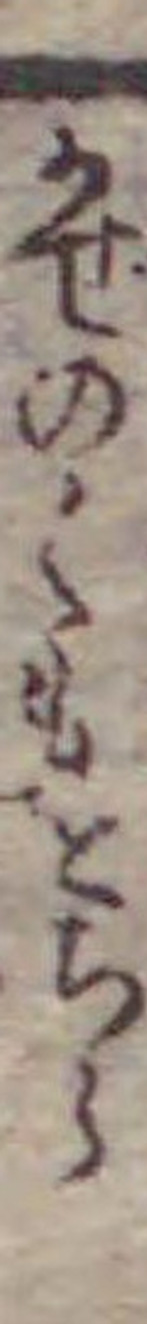かぜのくもをちら
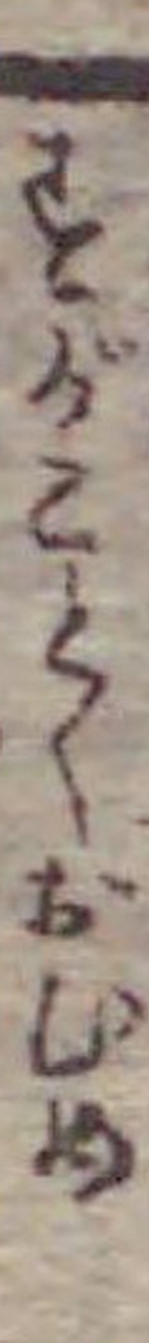すがことくおむめ
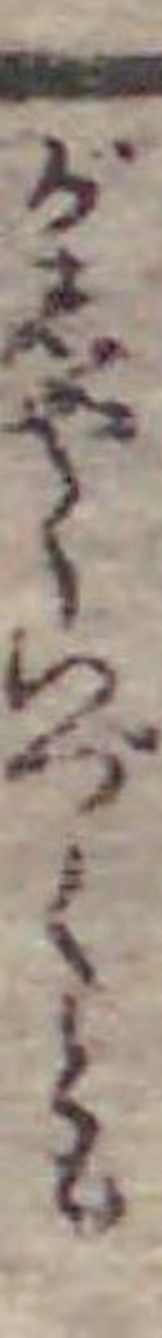がしやくいづくとも
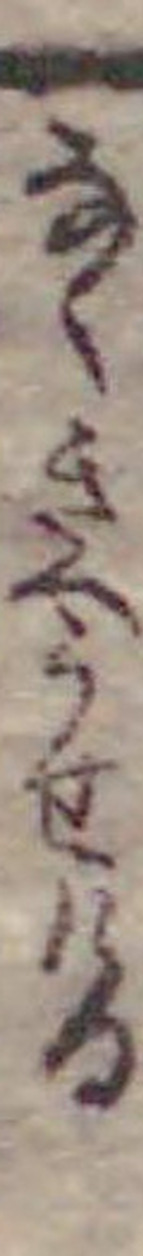なくきへうせける
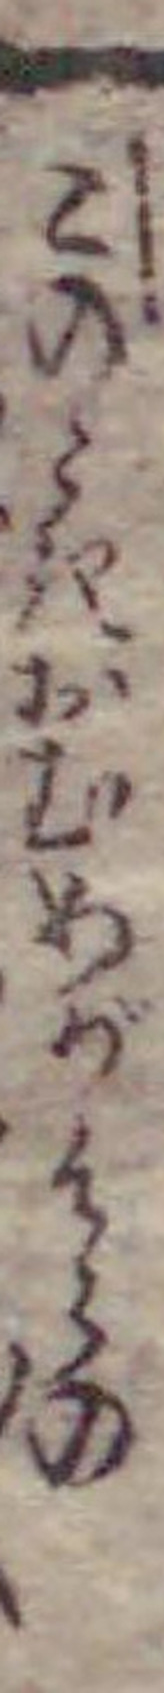このときおむめがはらの
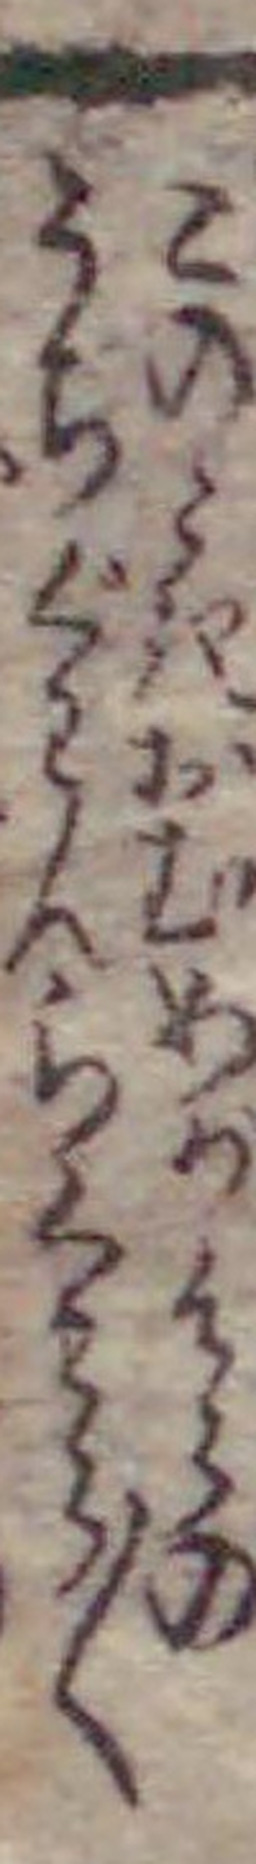うちぐわんらくわら〳〵
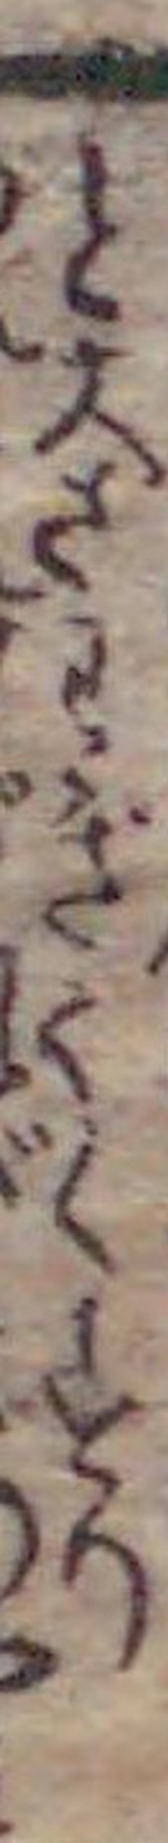と大さわぎてくすり
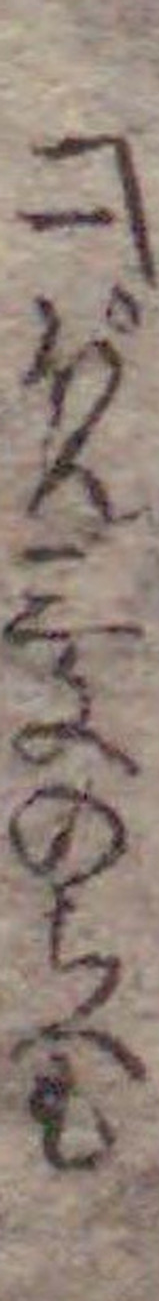〽一ぼん三文のちへも
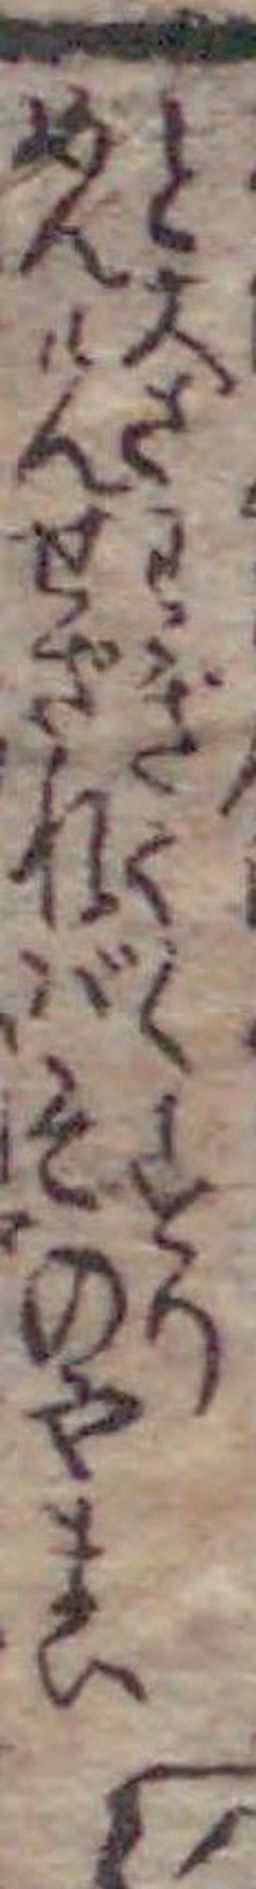めんけんせざればそのやまい
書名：鼻下長生薬 : 3巻
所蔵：国立国会図書館 National Diet Library, JAPAN
